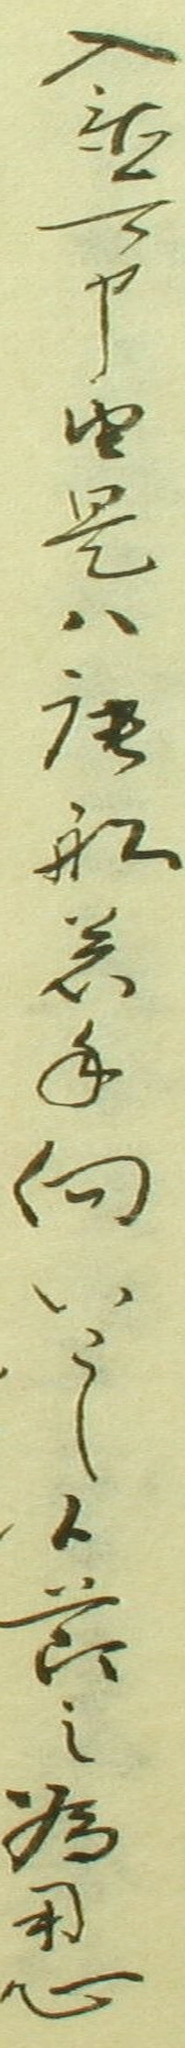入置可申由是は唐船若手向いたし候節之為用心
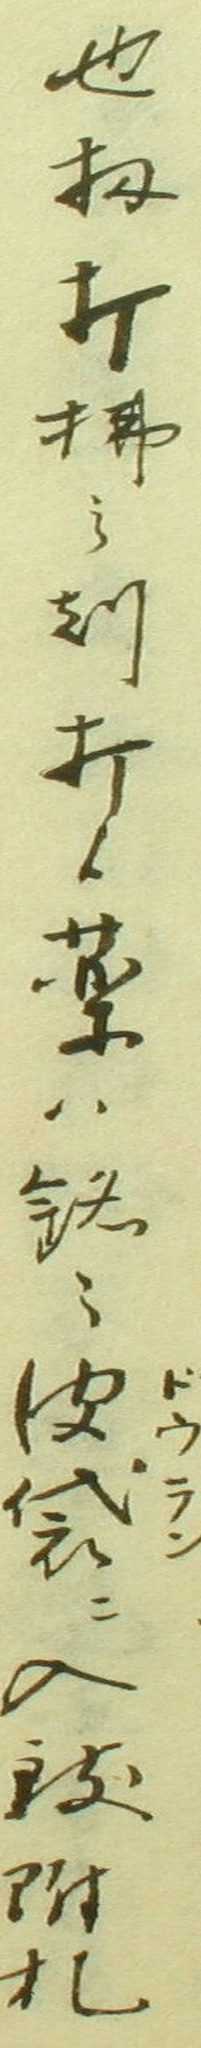也扨打払之刻打候薬は銘々皮袋ニ入致附札
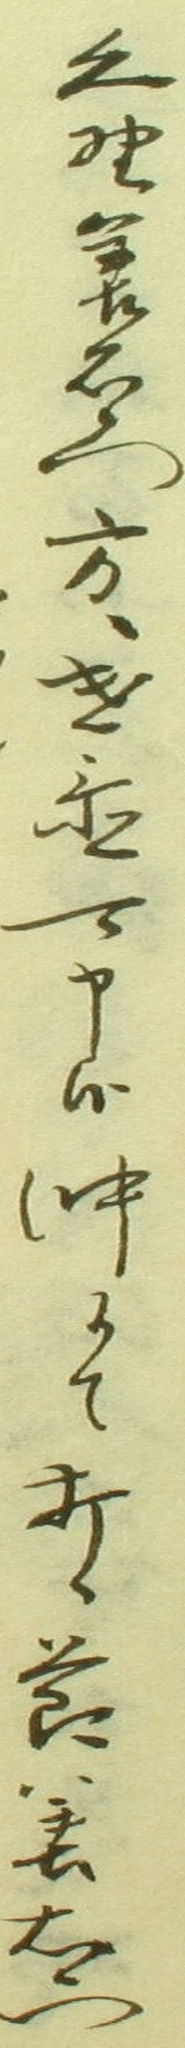久野善右衛門方へ遣置可申候沖にて打候節善右衛門
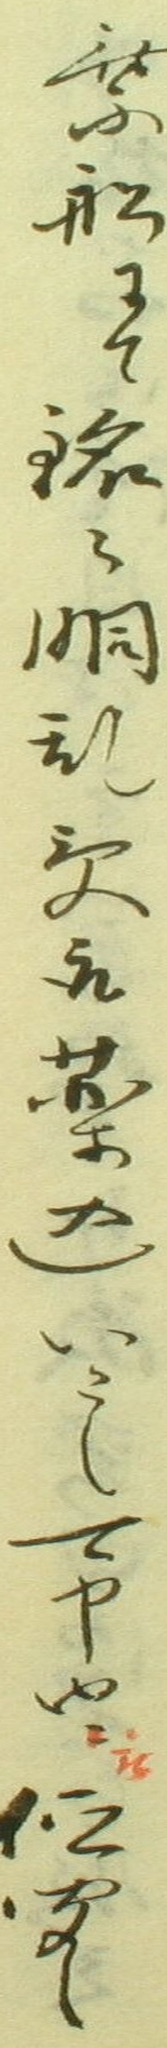乗船にて銘々胴乱受取薬込いたし可申やに仰聞候
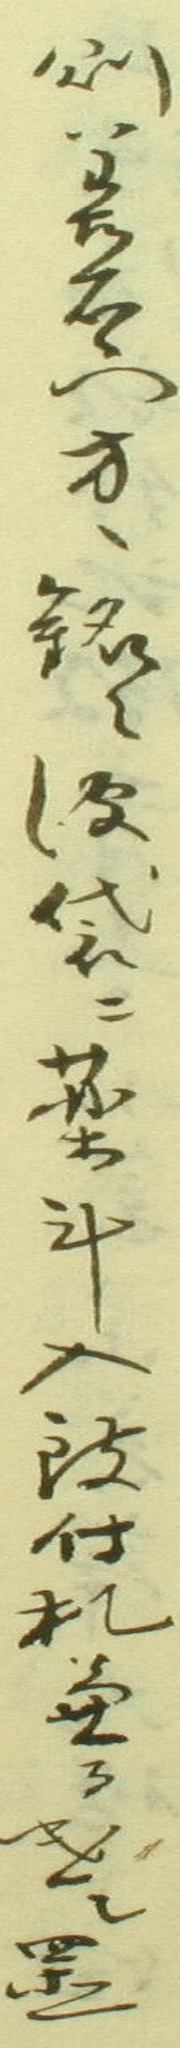則善右衛門方へ銘々皮袋ニ薬斗入致付札兼而遣し置
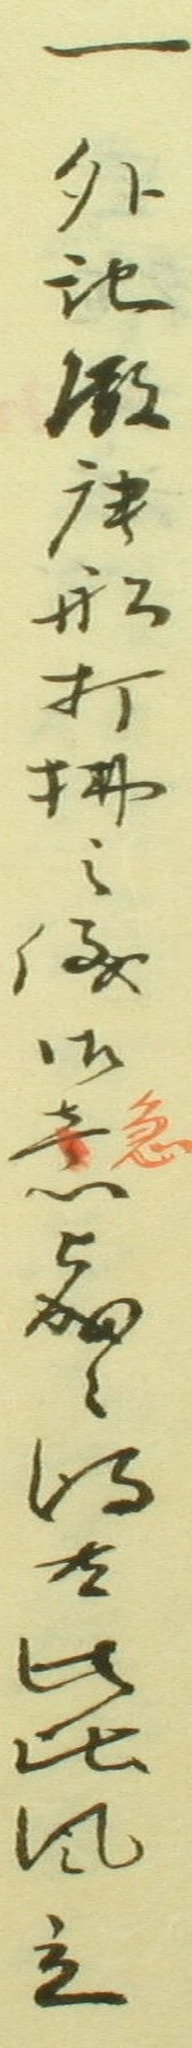一外記殿唐船打払之儀御急被成候得共此頃風立
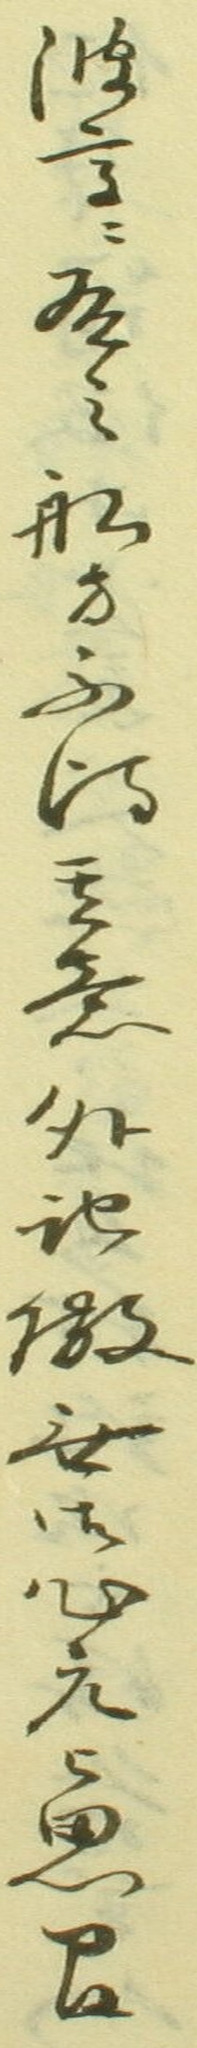波高ニ有之船方不得其意外記殿無御心元被思召
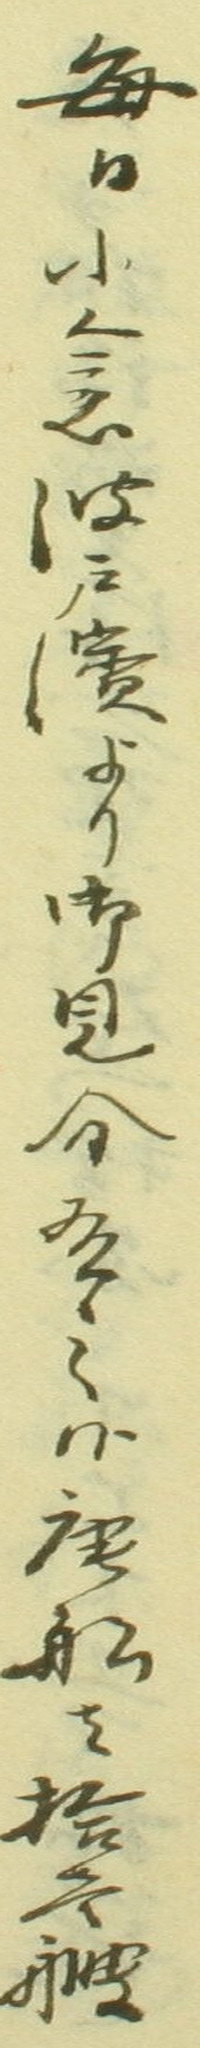毎日小倉波戸浜より御見分有之候唐船は拾壱艘
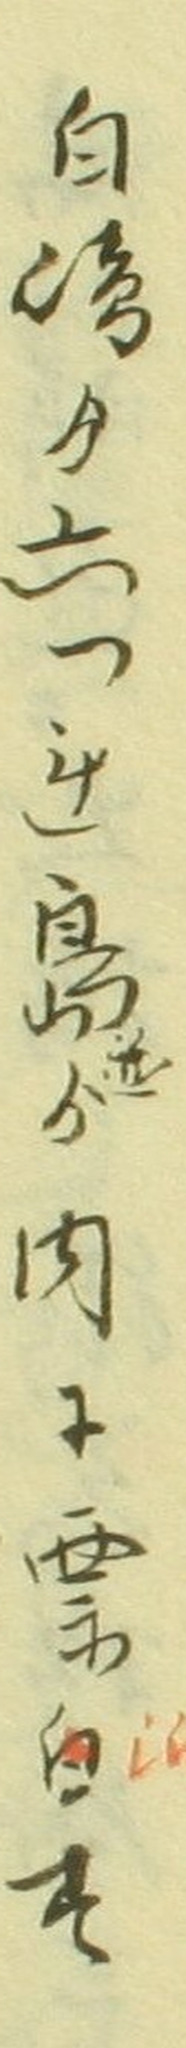白島ゟ六つ連島並ゟ内に漂泊す
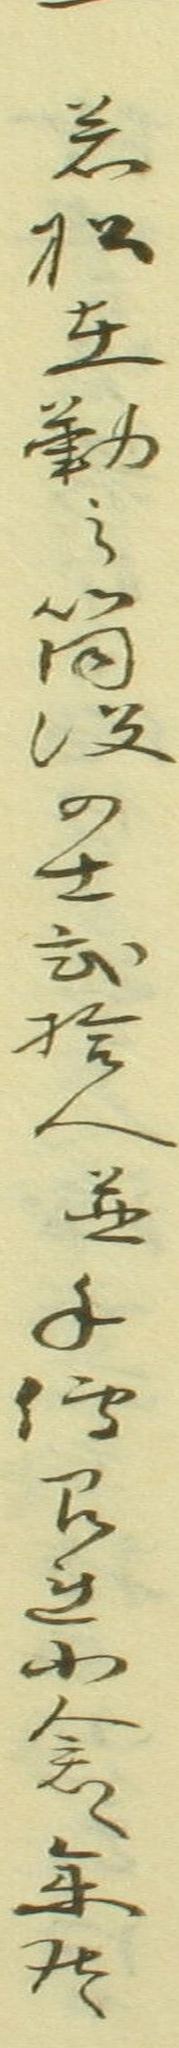一若松在勤之筒役の士弐拾人並手伝召連小倉へ参居候
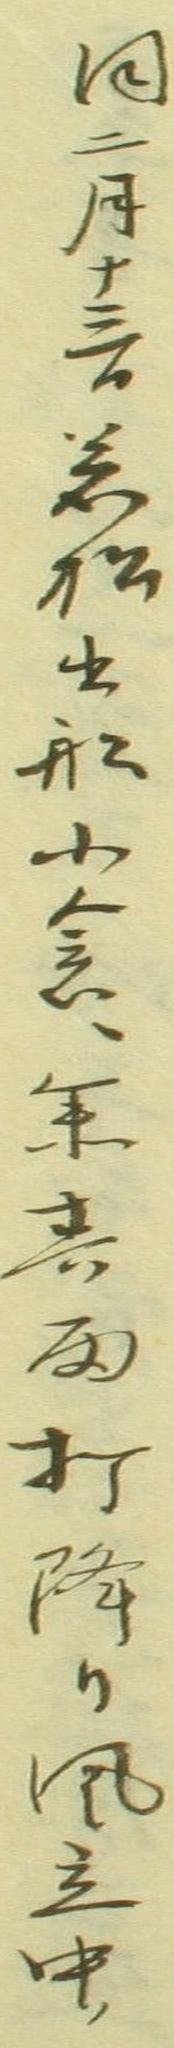同二月十三日若松出船小倉へ参春雨打降り風立中ノ
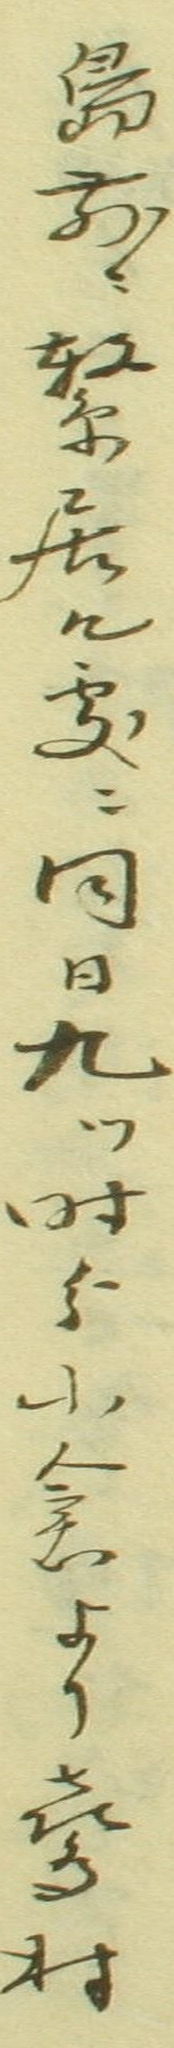島前ニ繋居候処ニ同日九ツ時分小倉より喜多村
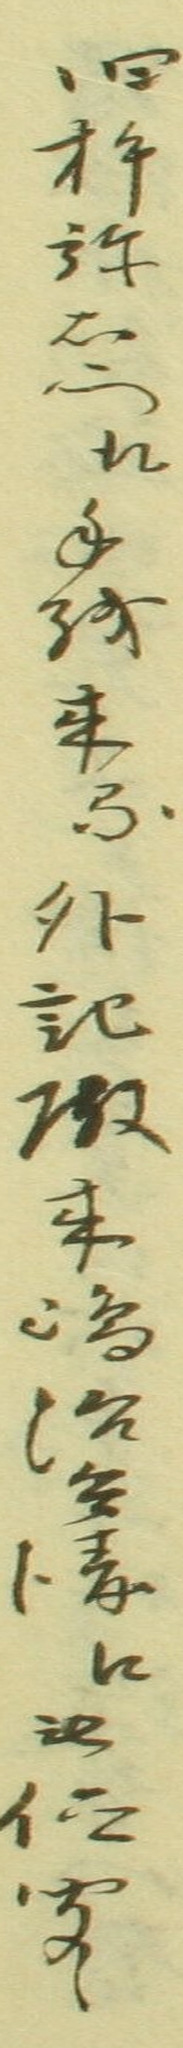臼杵弥右衛門江手紙来る外記殿来島治兵衛江被仰聞候
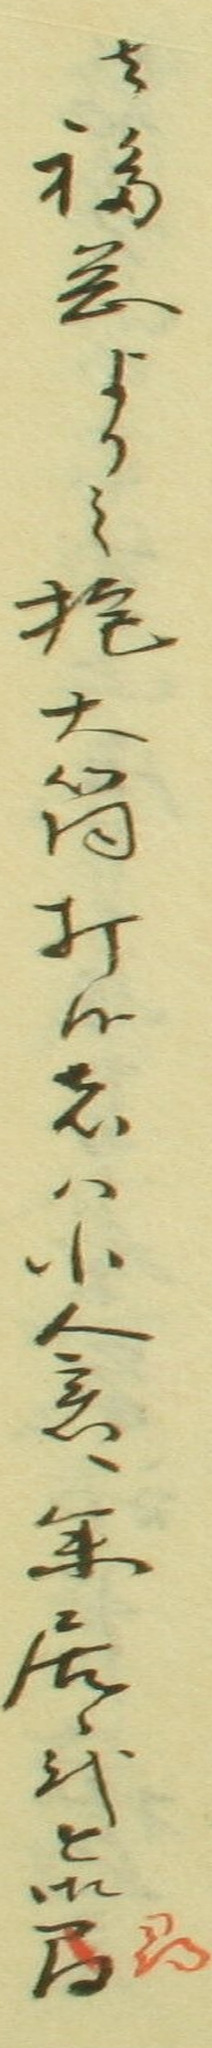は福岡より之抱大筒打候者は小倉へ参居候哉と御尋

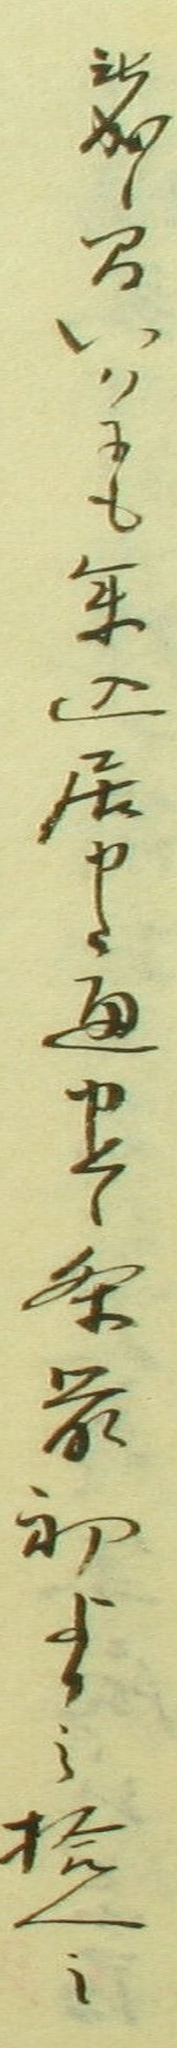被成候間いかにも参込居申候通申上候条最初より之拾人之
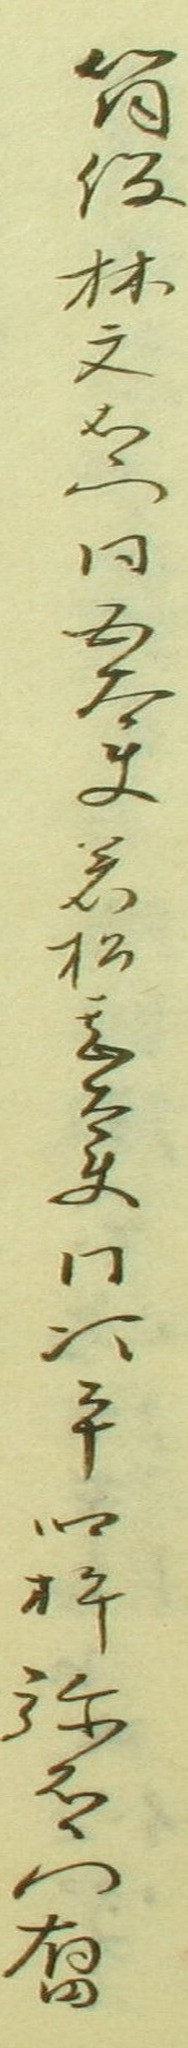筒役林文右衛門同五太夫若松甚太夫同次平臼杵弥右衛門有田
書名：唐船漂流記 二
